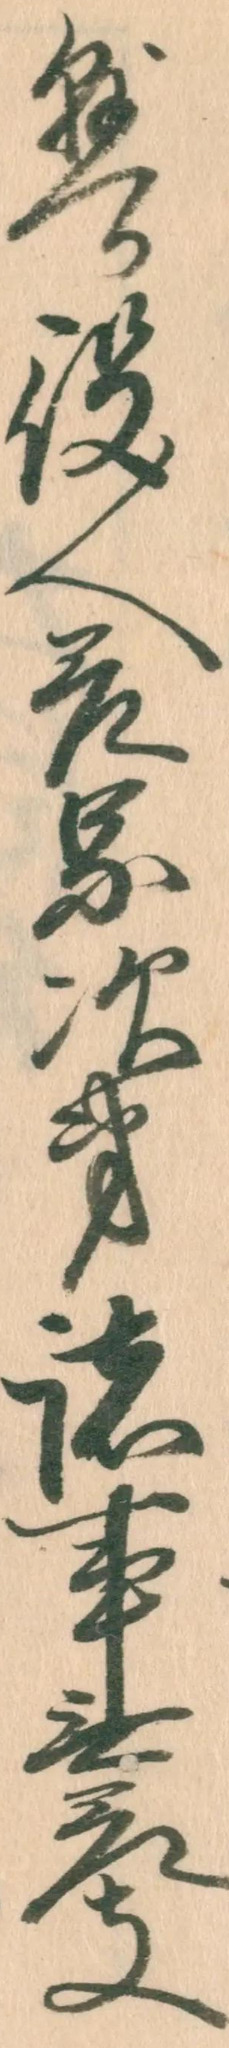懸り役人差図次第諸事無差支
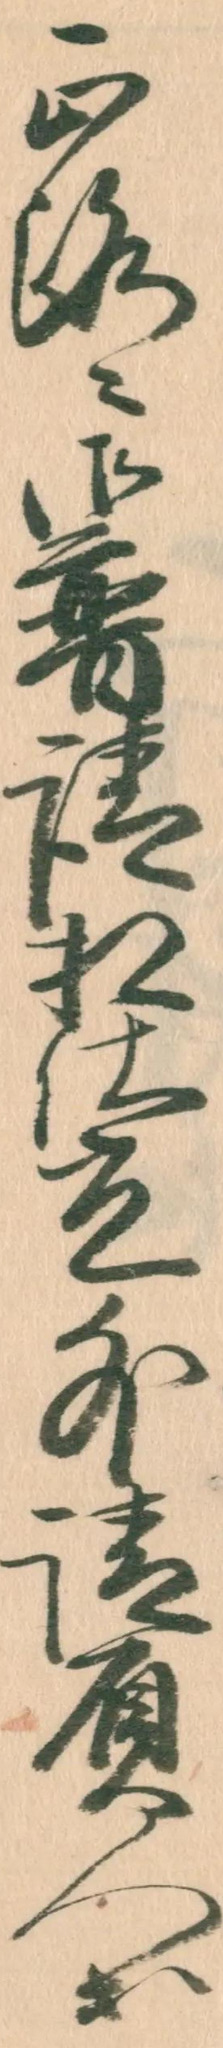正路ニ御普請相仕立外請負人等
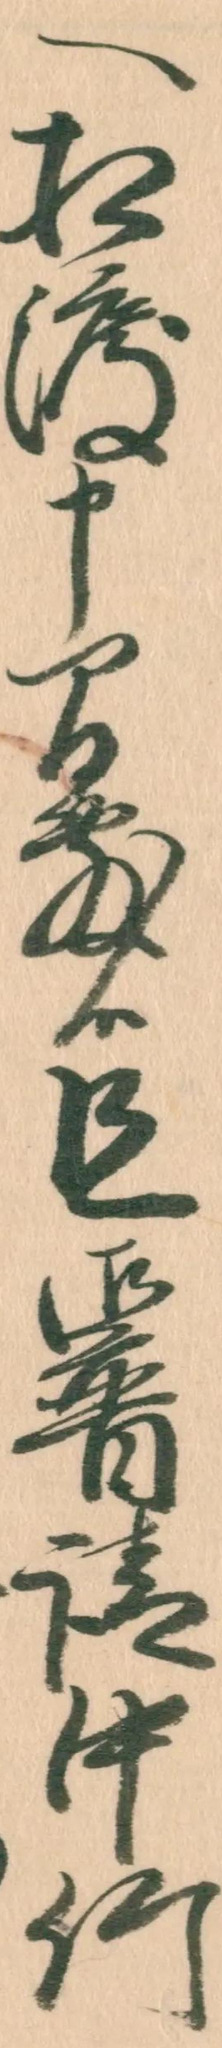へ相渡申間敷候且御普請中竹
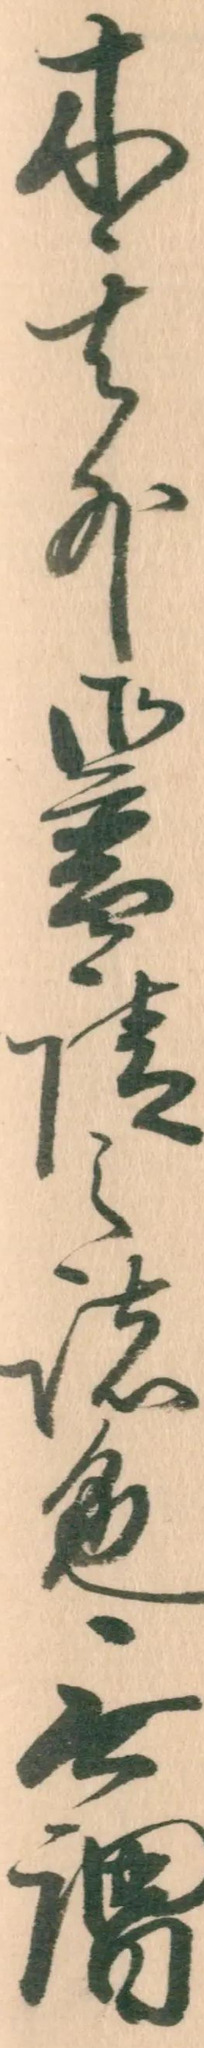木其外御普請之諸色無謂
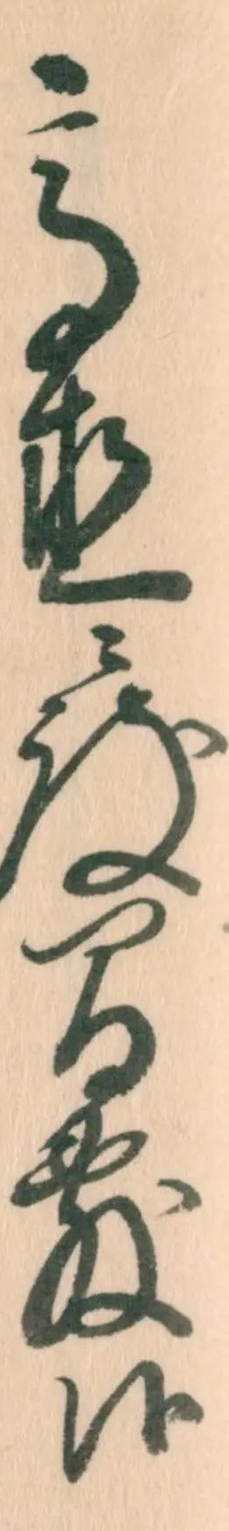高直ニ致間敷候
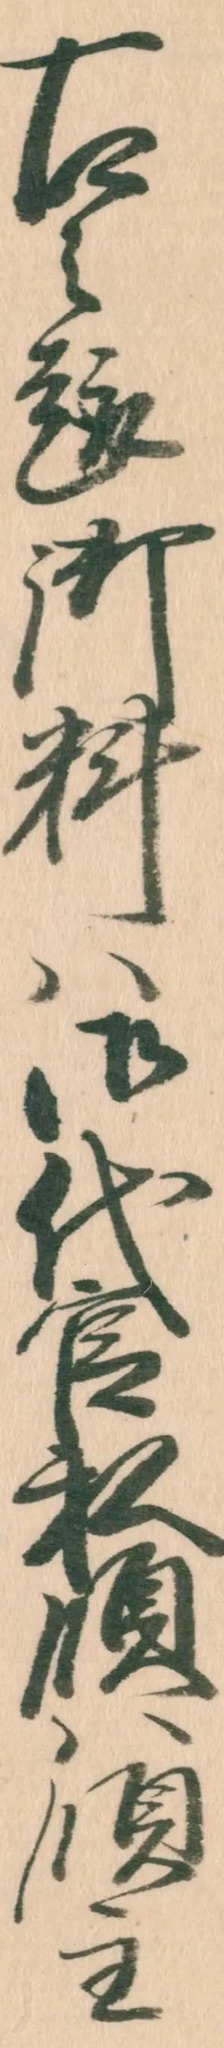右之趣御料ハ御代官私領ハ領主
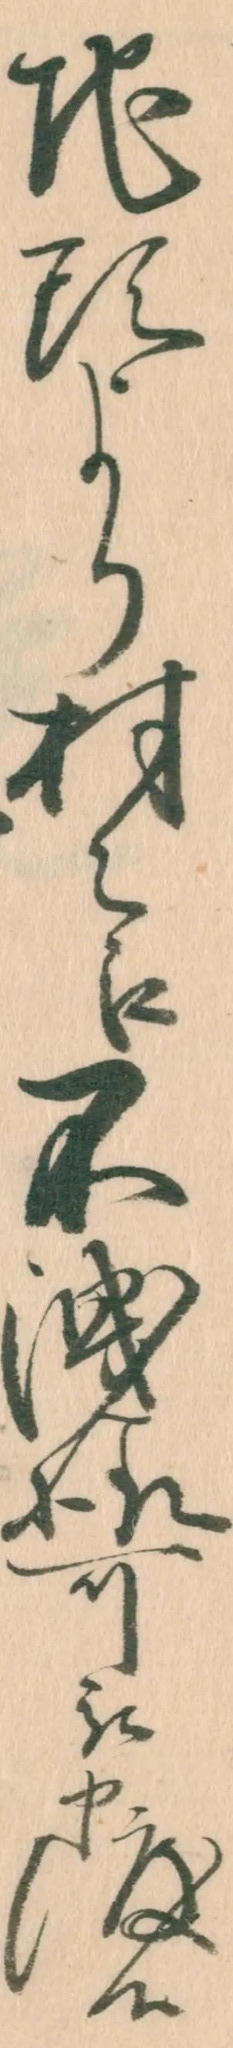地頭より村〻え不洩様可被申渡候
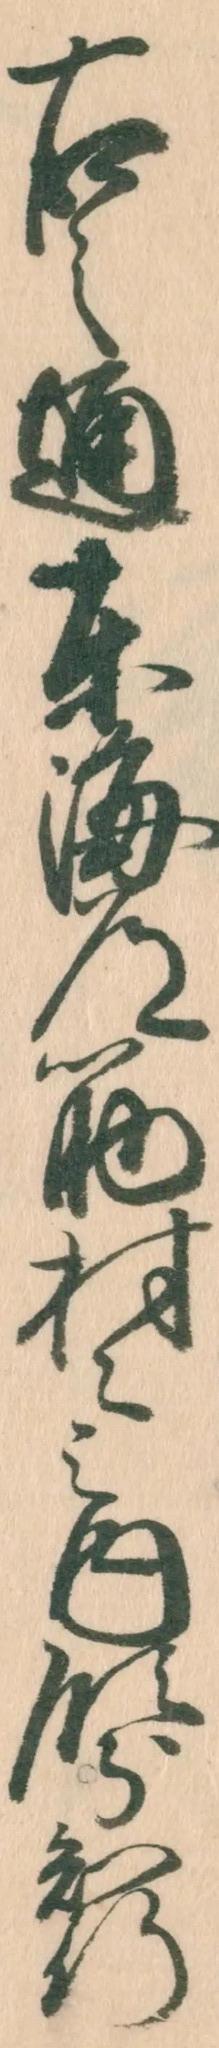右之通東海道筋村〻之内領分知行
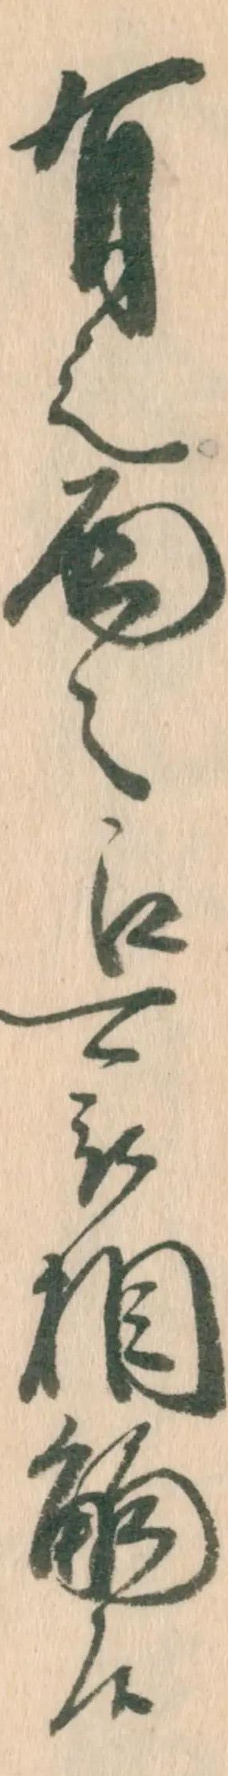有之面〻え可被相触候
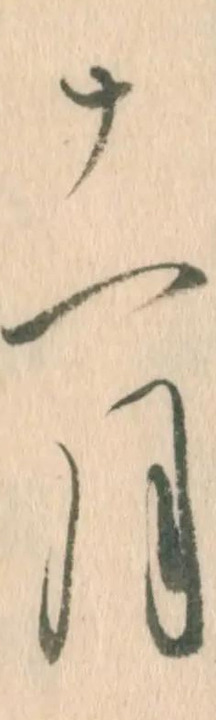十一月

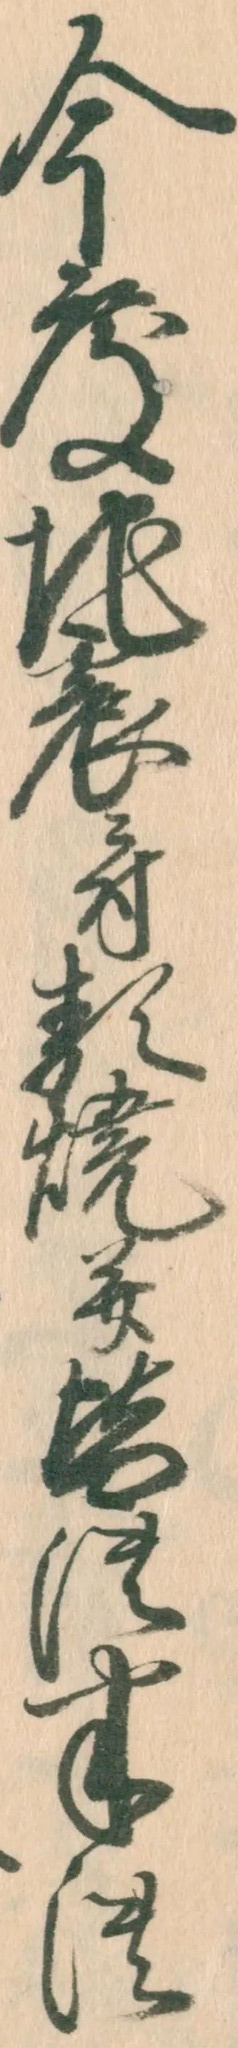今度地震ニ付類焼幷皆潰半潰
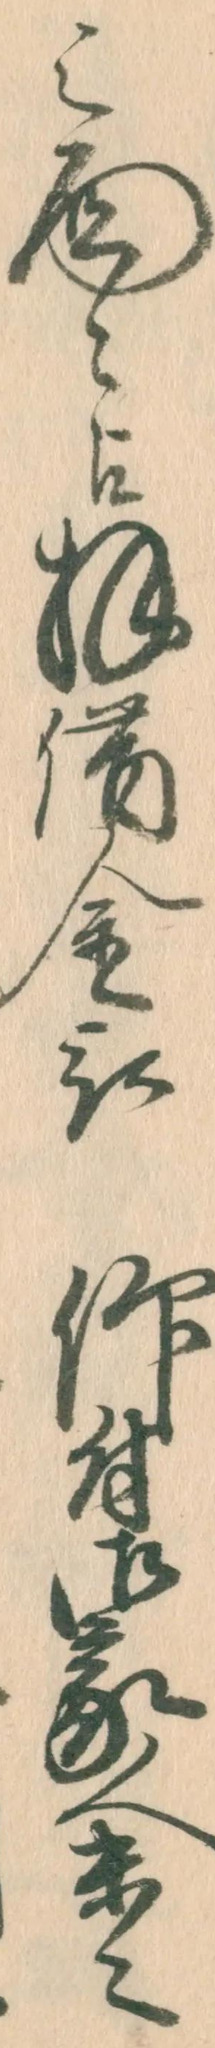之面〻え拝借金被仰付御家人末〻
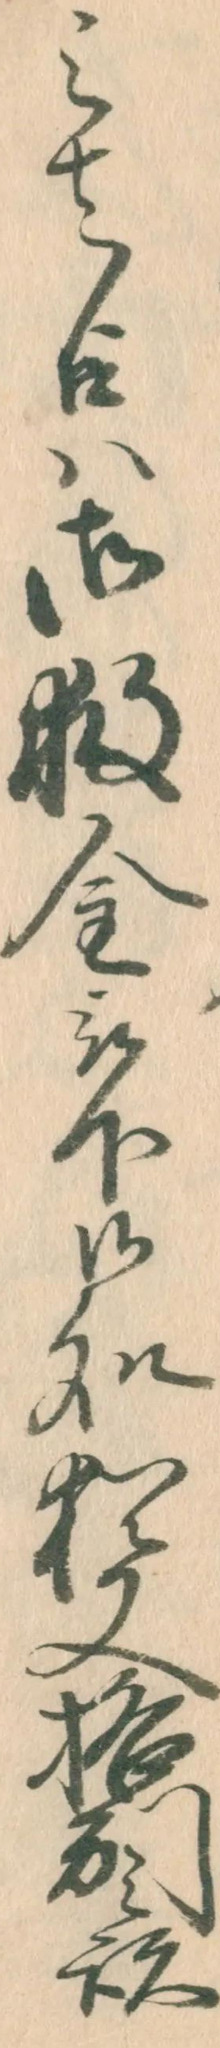之者えハ御救金被下候処猶又格別の訳

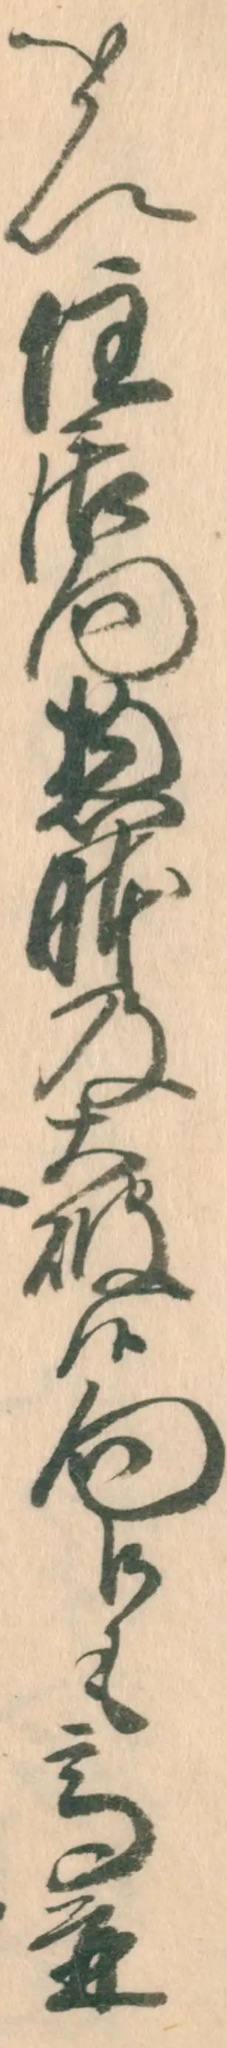を以住居向惣体及大破候向えも高並
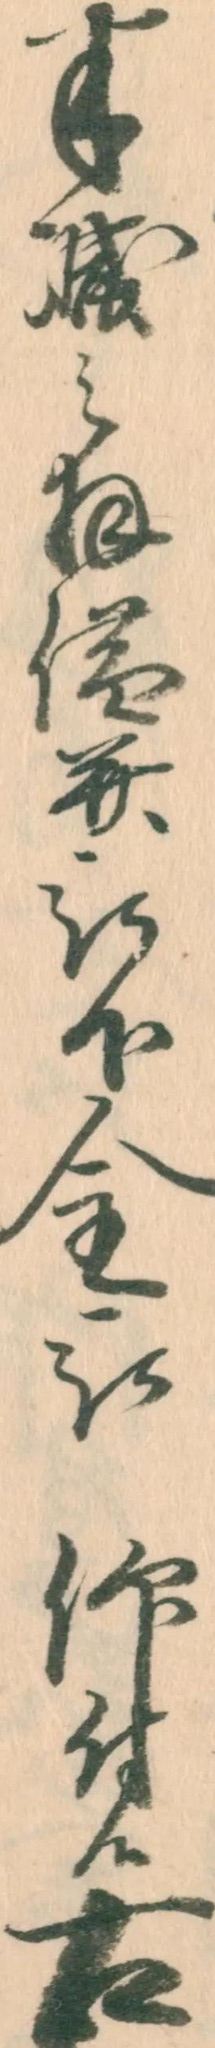半減之拝借幷被下金被仰付候右
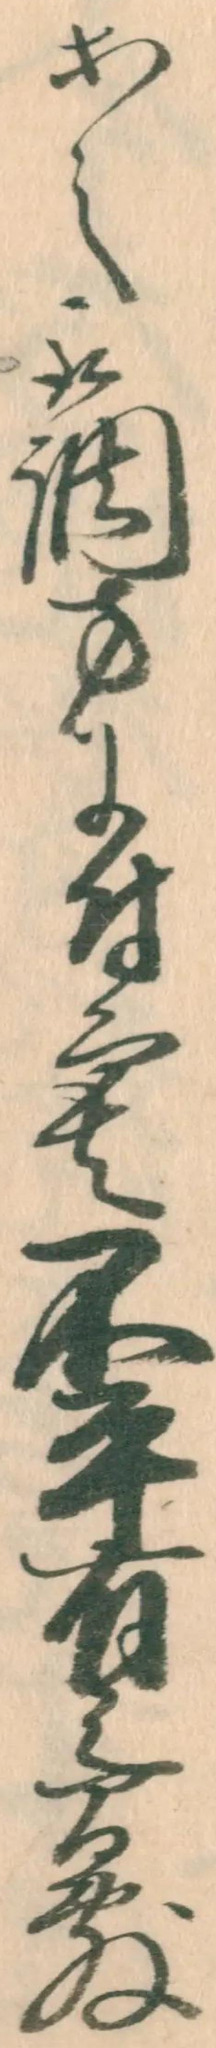等之取調方に付ては不平有之間敷
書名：地震災書留 2巻. [2] 内表紙に「地震一件　安政二卯年十月」とあり
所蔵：国立国会図書館 National Diet Library, JAPAN
